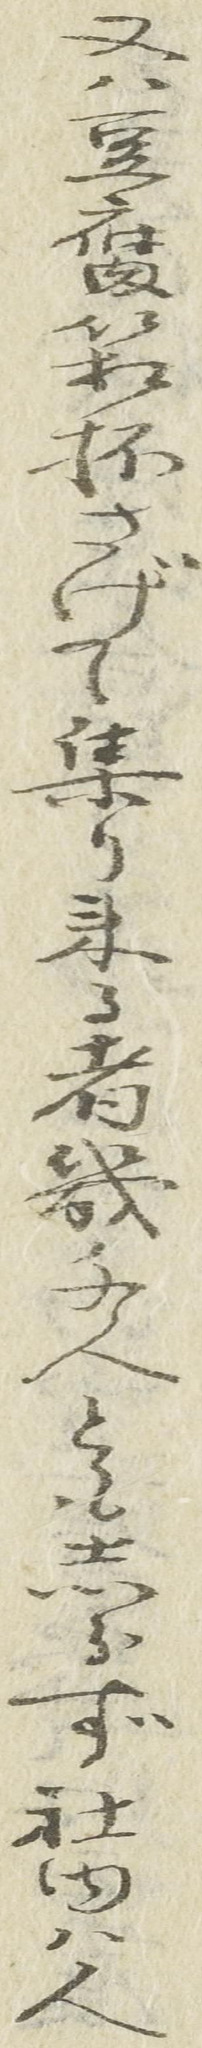又は豆腐箱抔さげて集り来る者幾千人ともしらず社内は人
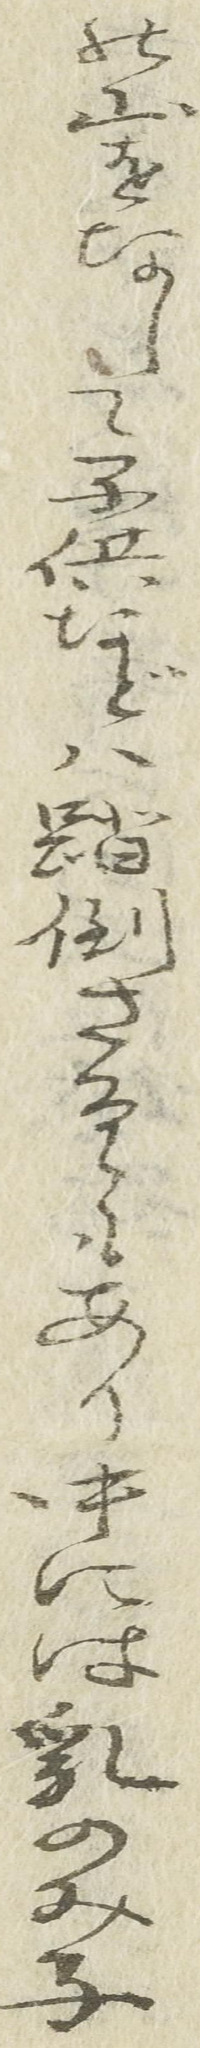の山をなして子供などは踏倒さるゝもあり中には乳のみ子
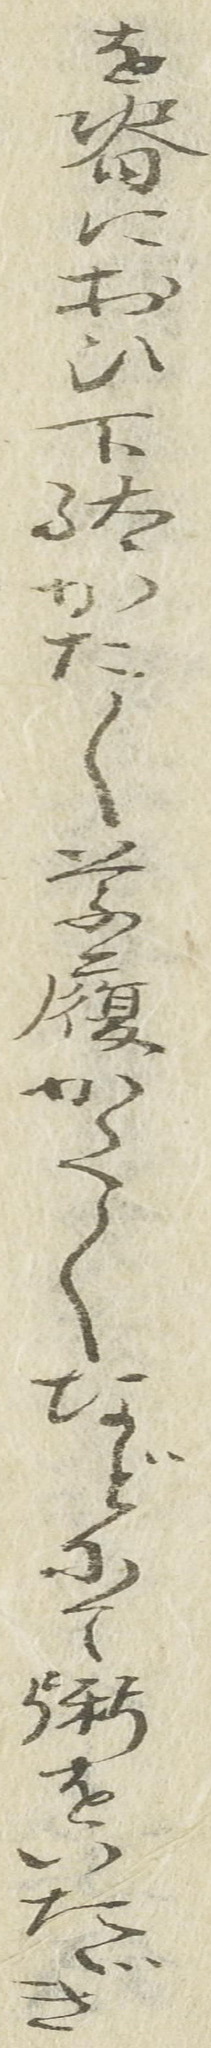を脊におひ下駄かた〳〵草履かく〳〵などにて粥をいたゞき
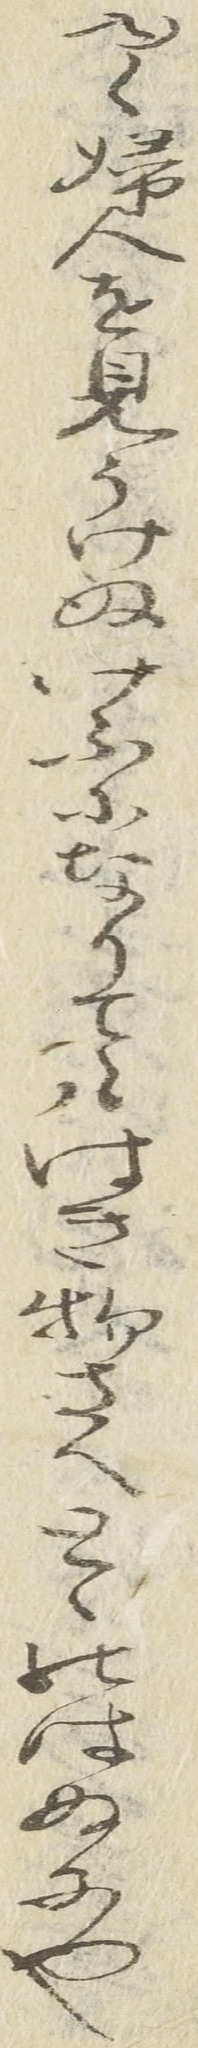ゆく婦人を見うけぬけふになりてもはき物さへとゝのはぬにや
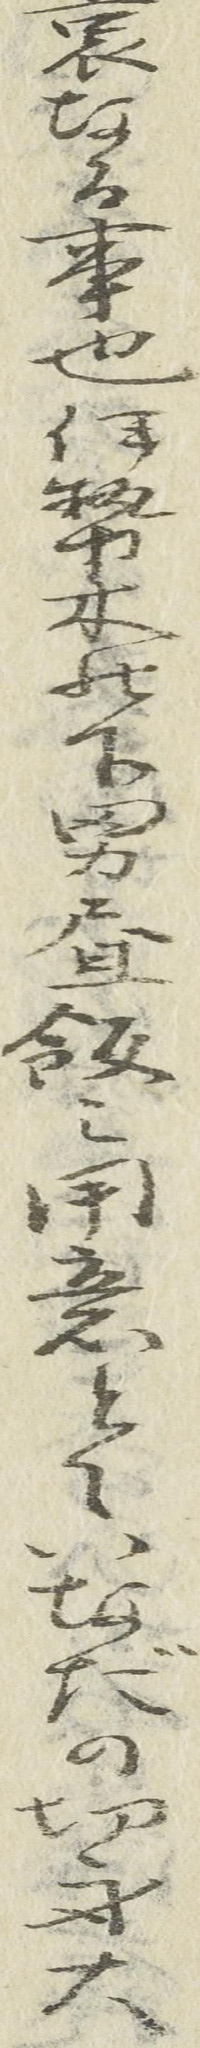哀なる事也伊勢木の下男昼飯の用意とていなだの切身大
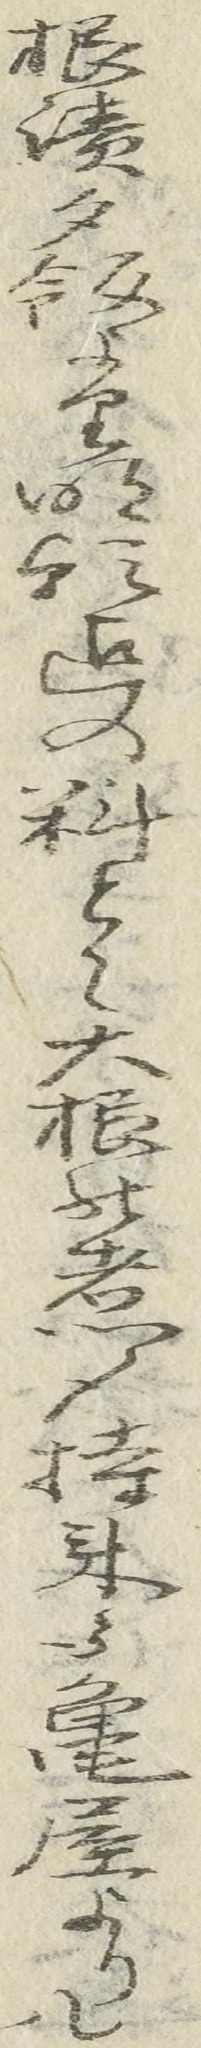根漬夕飯より明朝迄の料とて大根の煮〆持来る亀屋よりも
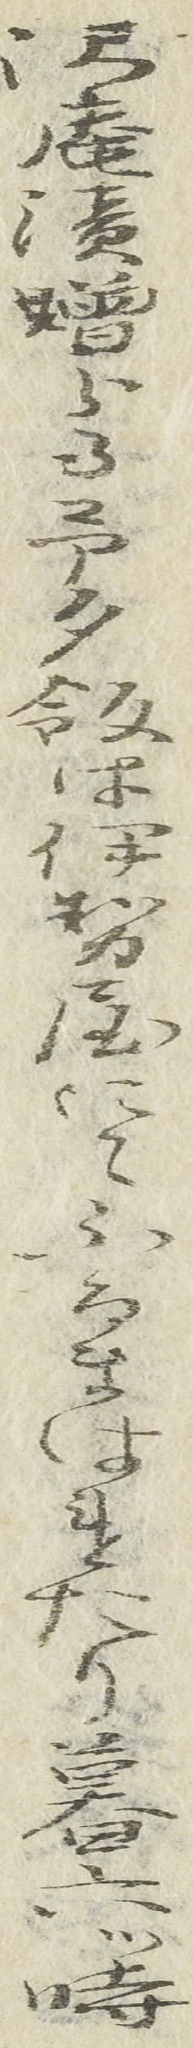沢庵漬贈らる予夕飯は伊勢屋にてふるまはれたり暮六ツ時
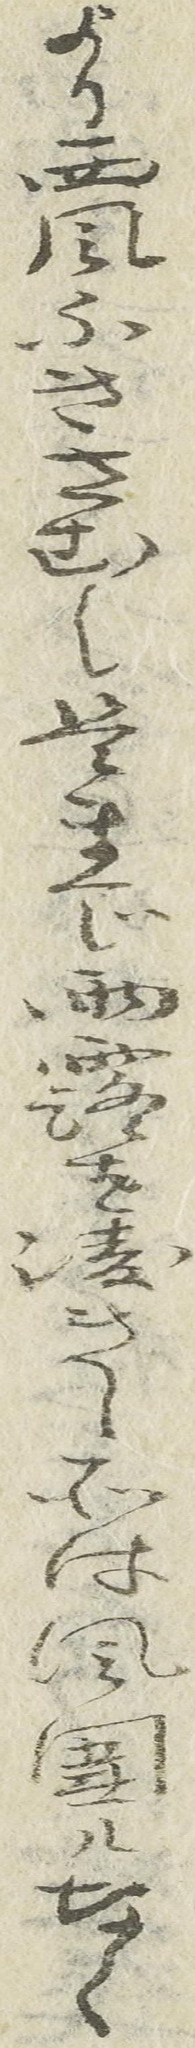より西風ふきさむし是まで雨露を凌きし所は風囲もなく
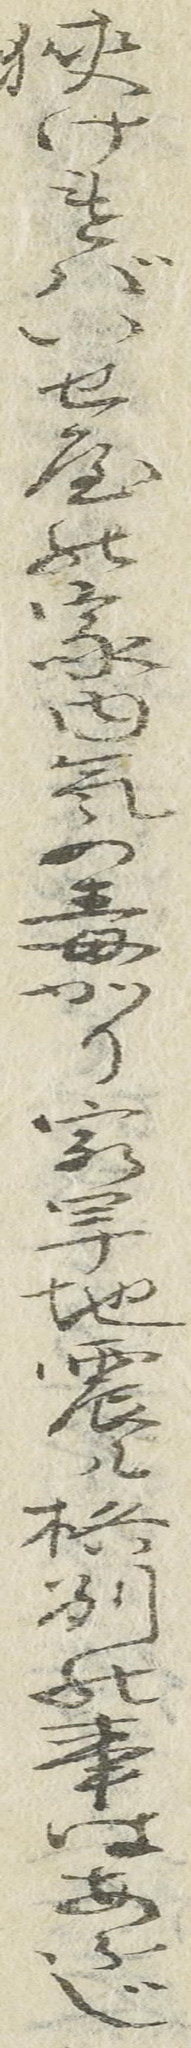狭けれバいせ屋の家内気の毒がり最早地震も格別の事はあらじ
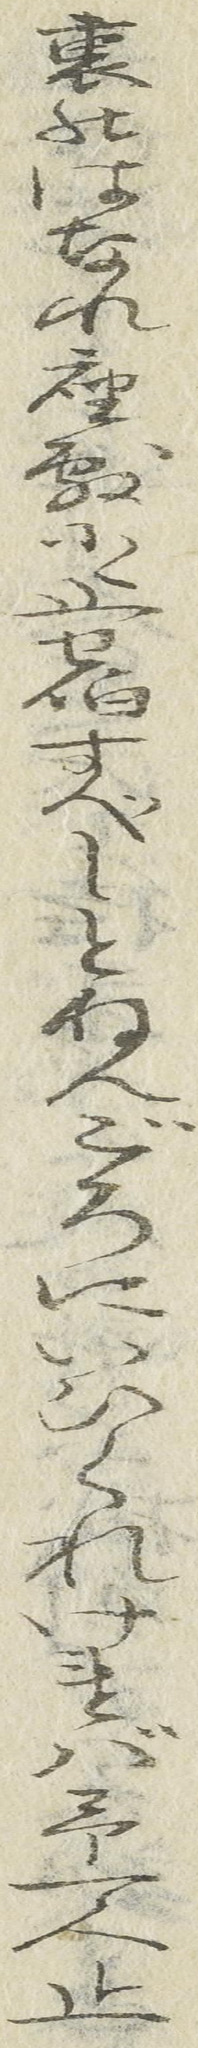裏のはなれ座敷に止宿すべしとねんごろにいひくれけれバ予一人止
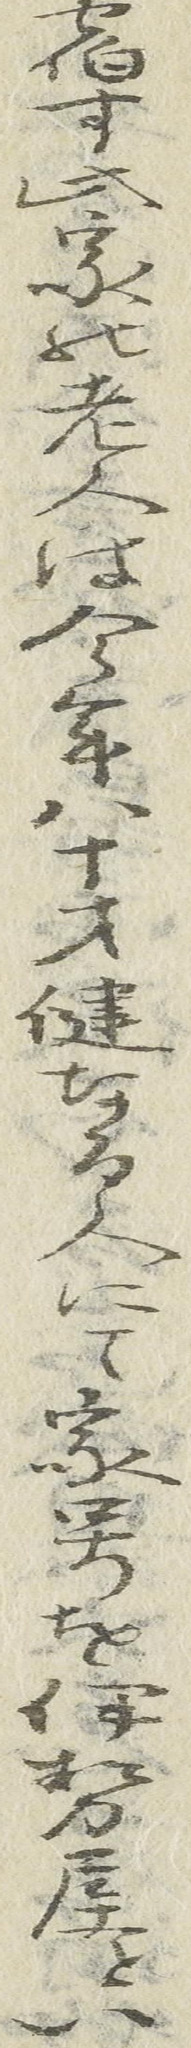宿す此家の老人は今年八十才健なる人にて家号を伊勢屋とい
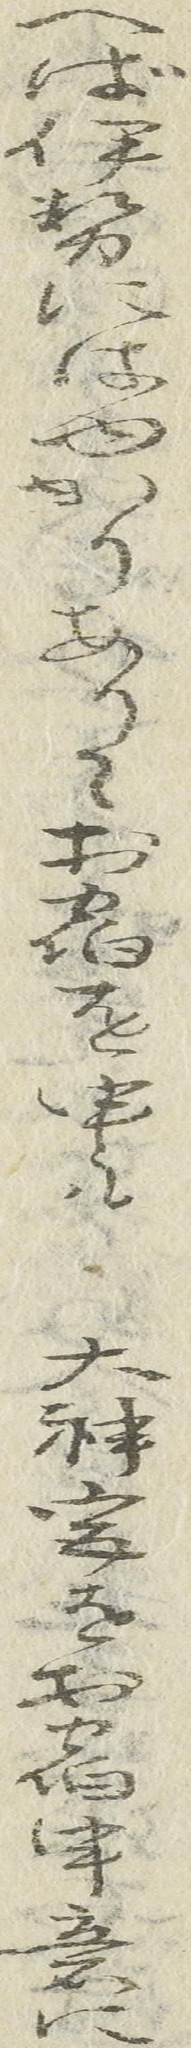へば伊勢にはゆかりありてお宿を申も大神宮をお宿申意に
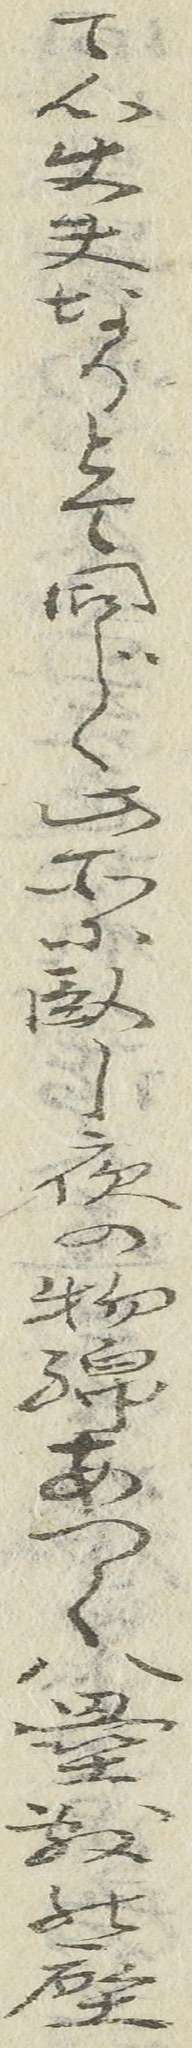て心丈夫なりとて同じく此所に臥し夜の物綿あつく八畳敷の座
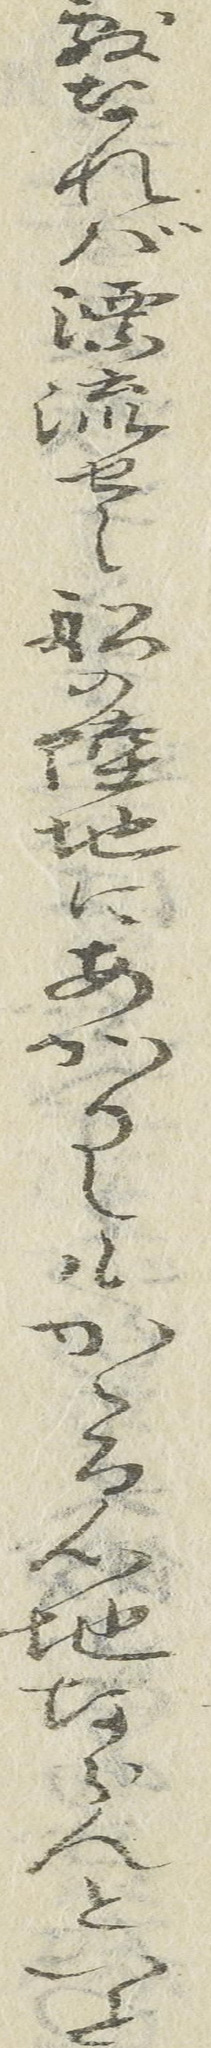敷なれば漂流せし船の陸地にあがりしもかゝる心地ならんといと
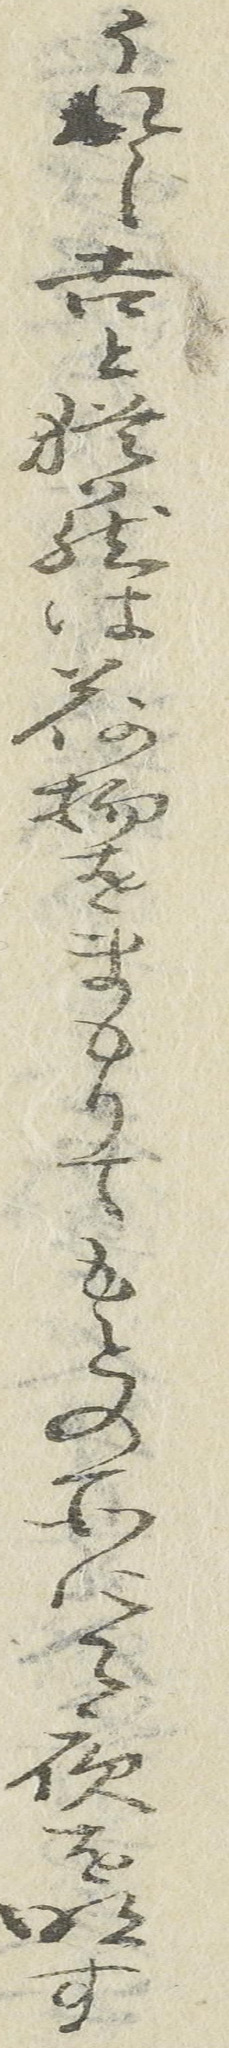うれし吉と猶蔵は荷物をまもりてもとの所にて夜を明す

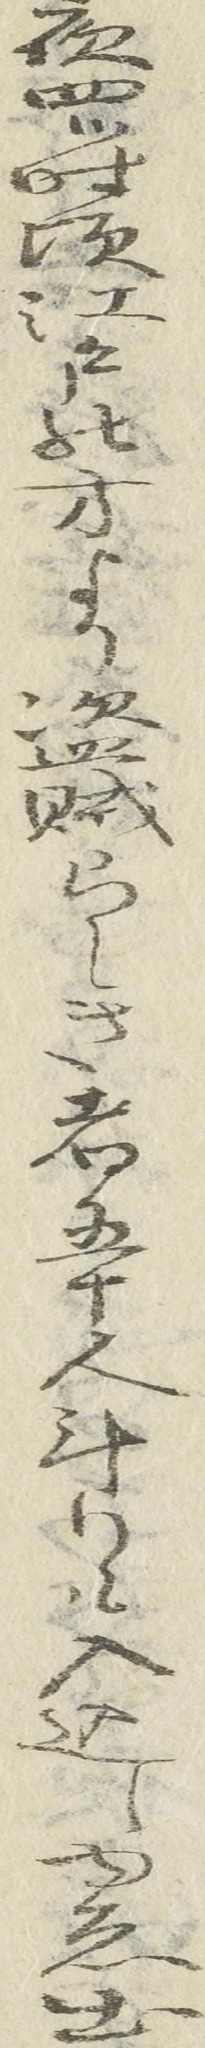夜四時頃江戸の方より盗賊らしき者五十人斗りも入込しゆえ出
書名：地震前兆集　全
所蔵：東京大学地震研究所図書室 Earthquake Research Institute Library, The University of Tokyo, JAPAN
